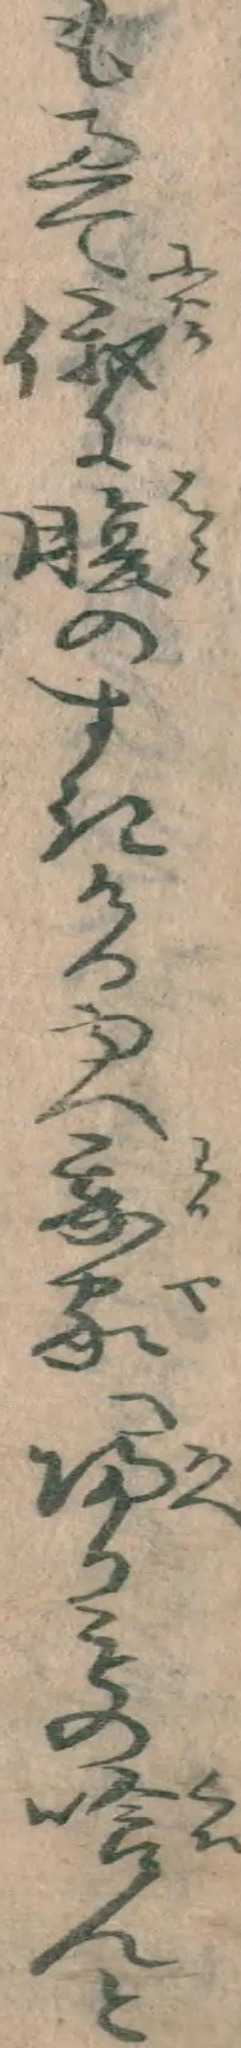も過て俄に腹のすきけるゆへ我家へ帰りもの喰んと
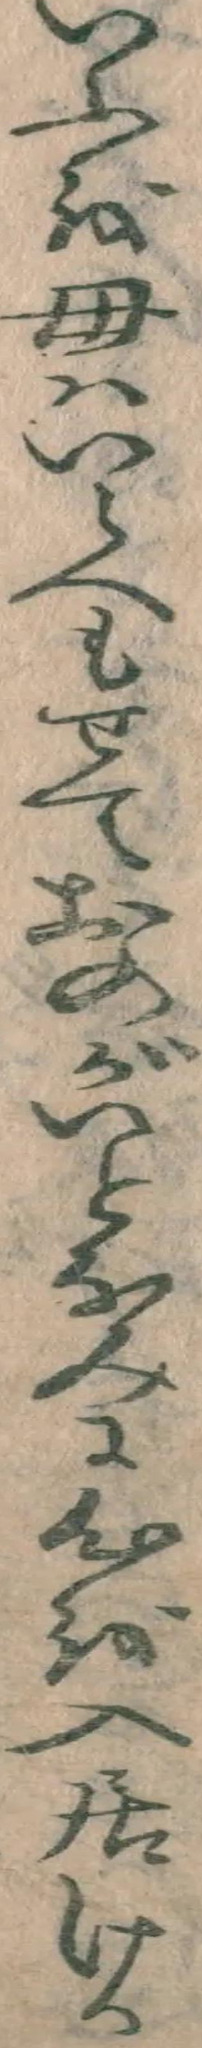いふを母はいらへもせておのがいとなみに心を入居ける
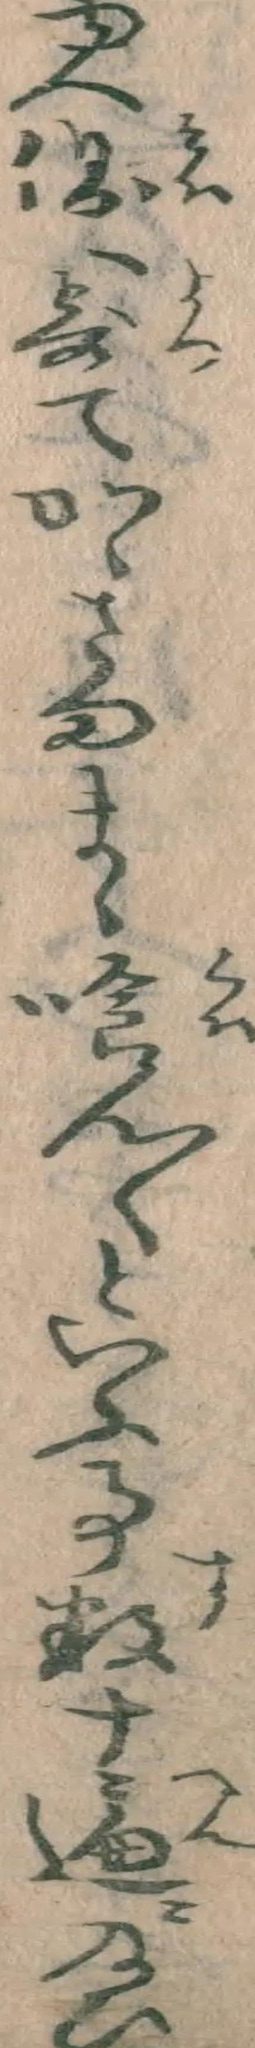ゆへ側へ寄てかゝさま喰ん〳〵といふ事数十遍及ひ
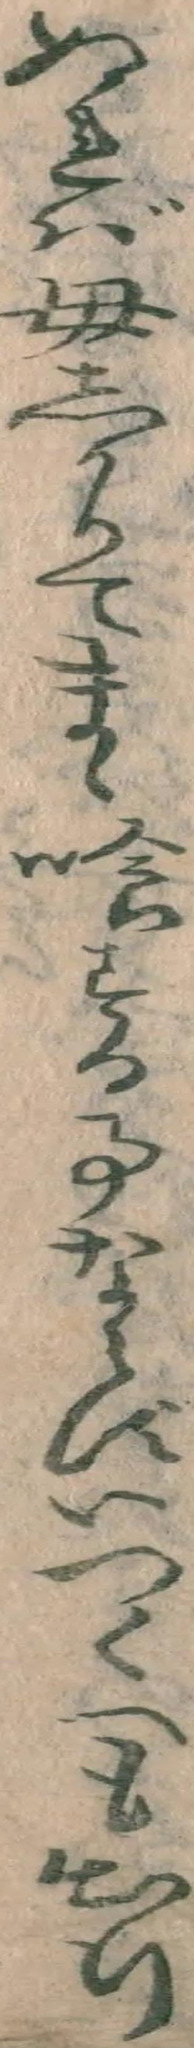ぬれば母しかりてまゝ喰する事ならずいつくへも出行
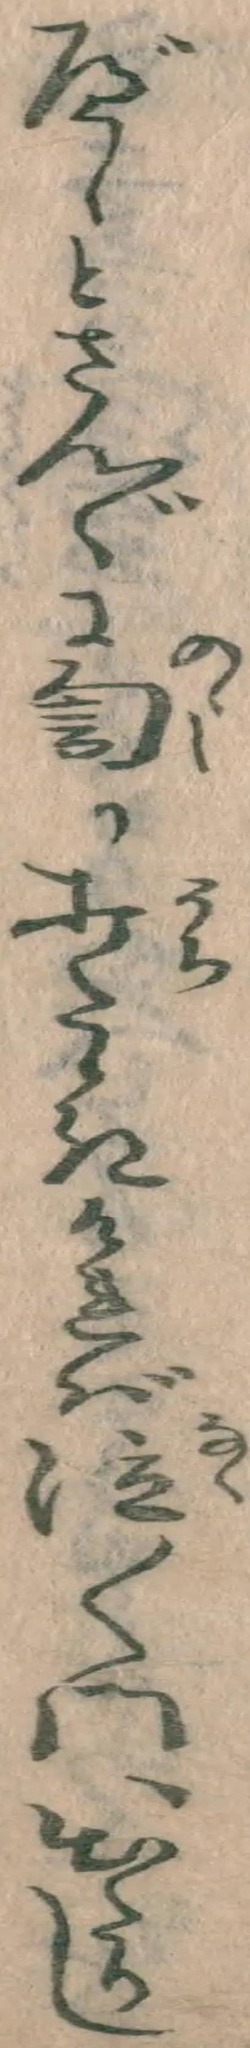べしとさん〴〵に訇り打たゝきければ泣〳〵門へ出たりし
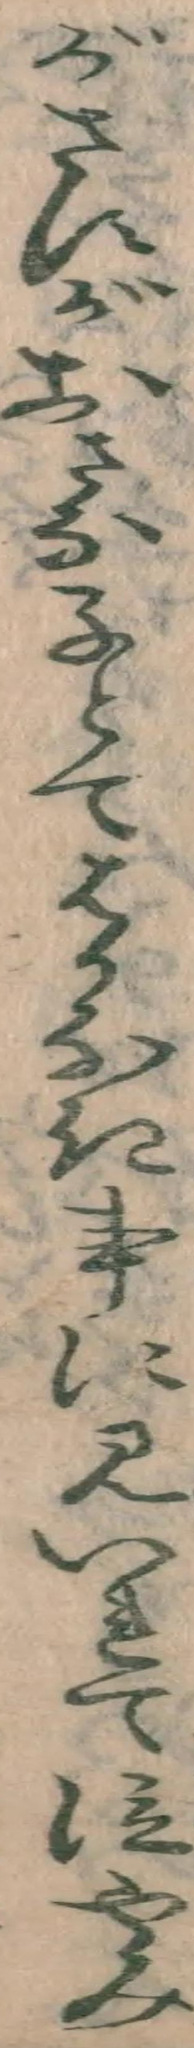がさすがおさな子とてはかなき事に見いれて泣やみ
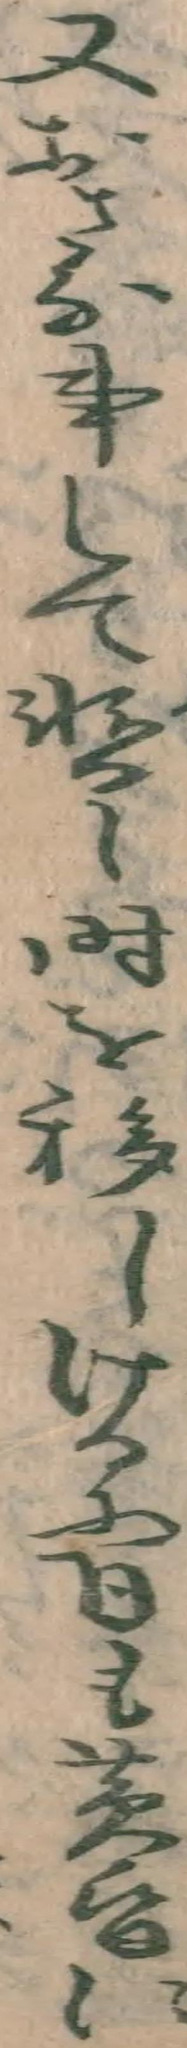又おさな事して暫し時を移しけるに日も黄昏に
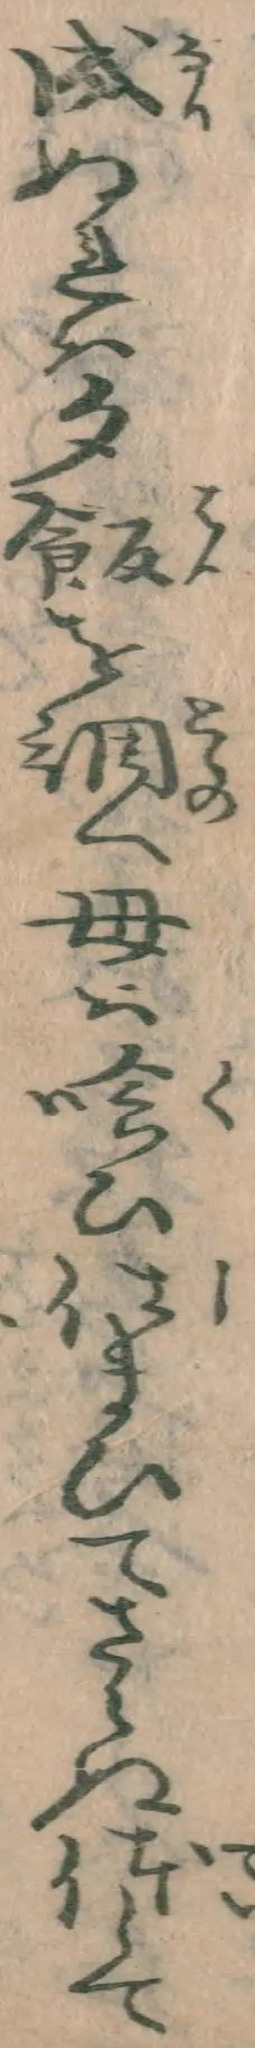成ぬれは夕飯を調へ母は？喰ひ仕まひてさらぬ体して
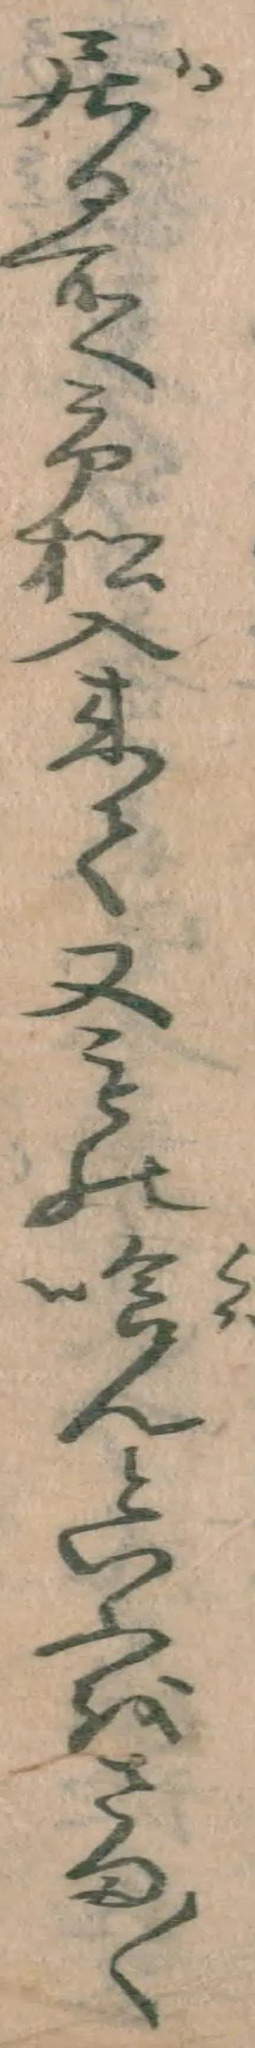居る所へ市松入来て又もの喰んといふをさま〳〵
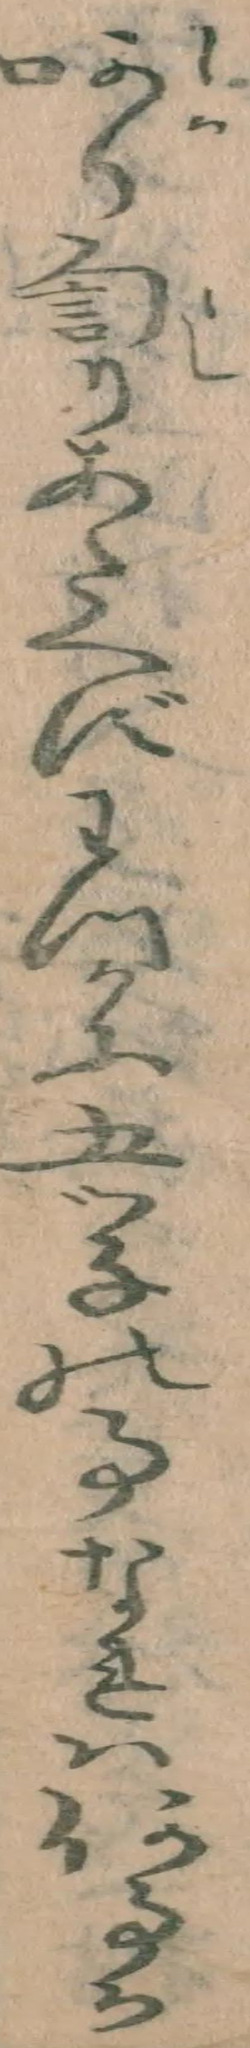呵り訇りあたへずわつかに五つ子の事なれは何事か
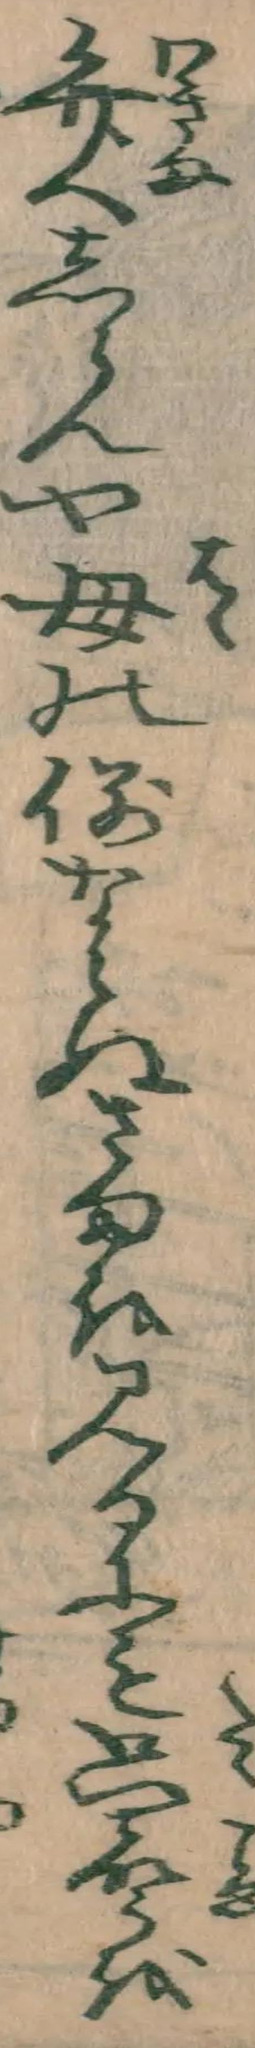弁へしらんや母の例ならぬさまを見るにも只声を
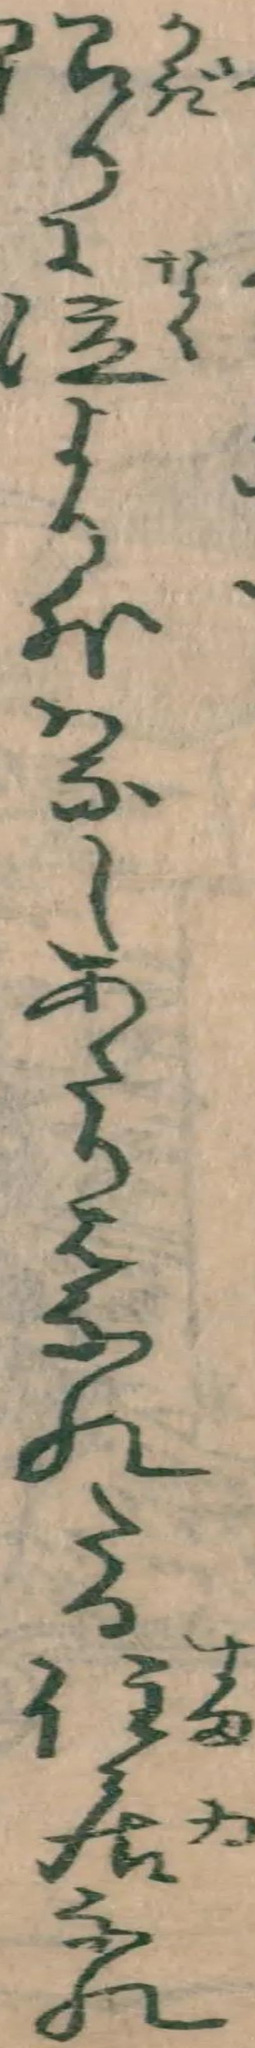限りに泣より外かなしあたりはなれたる住居なれ
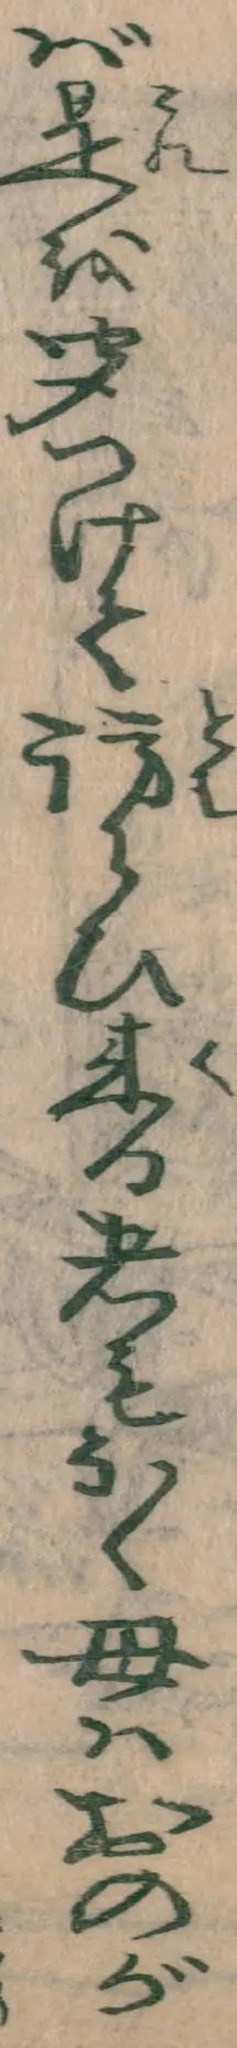ば是を聞つけて訪らひ来る者もなく母はおのが
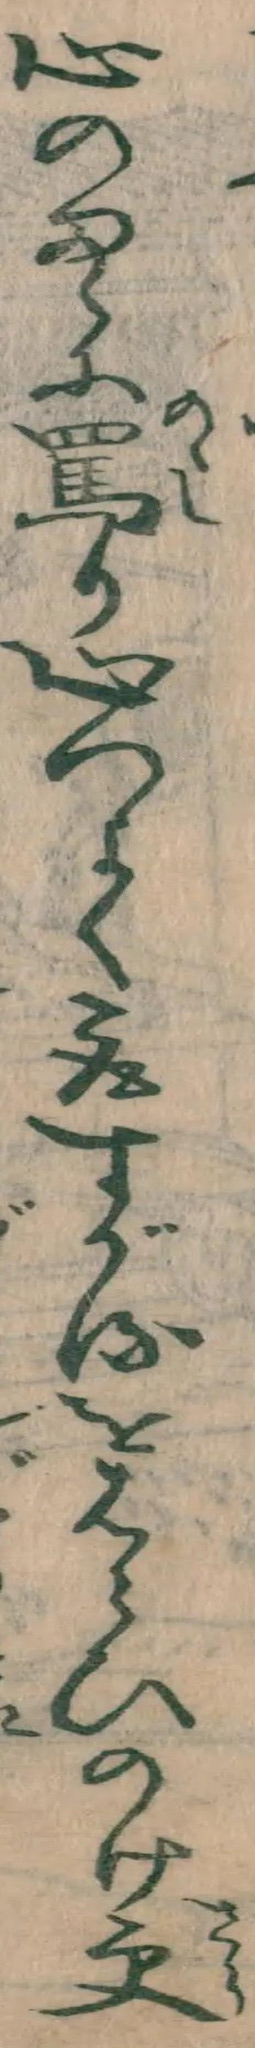心のまゝに罵り心つよく取すがるをはらひのけ更
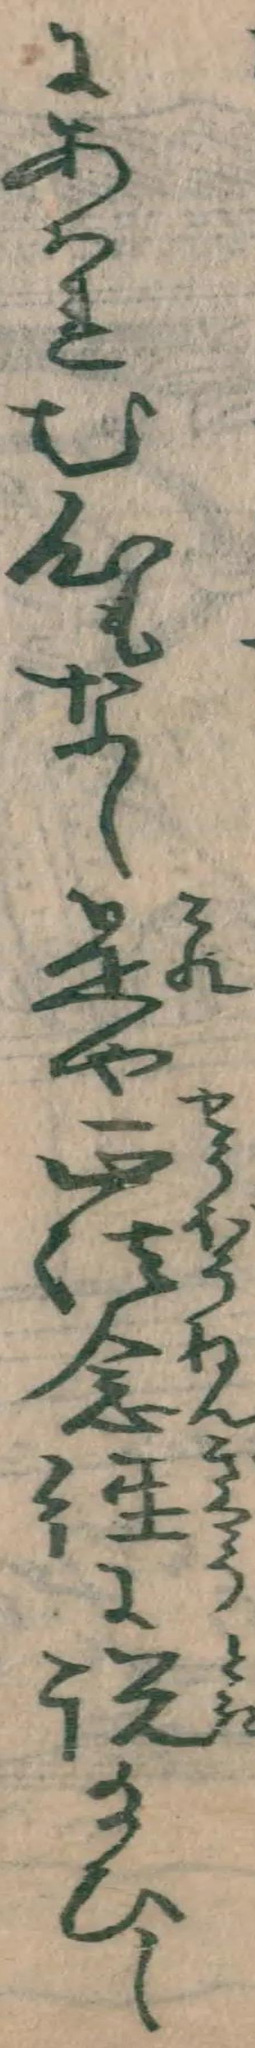にあはれむ心もなし是や正法念経に説給ひし
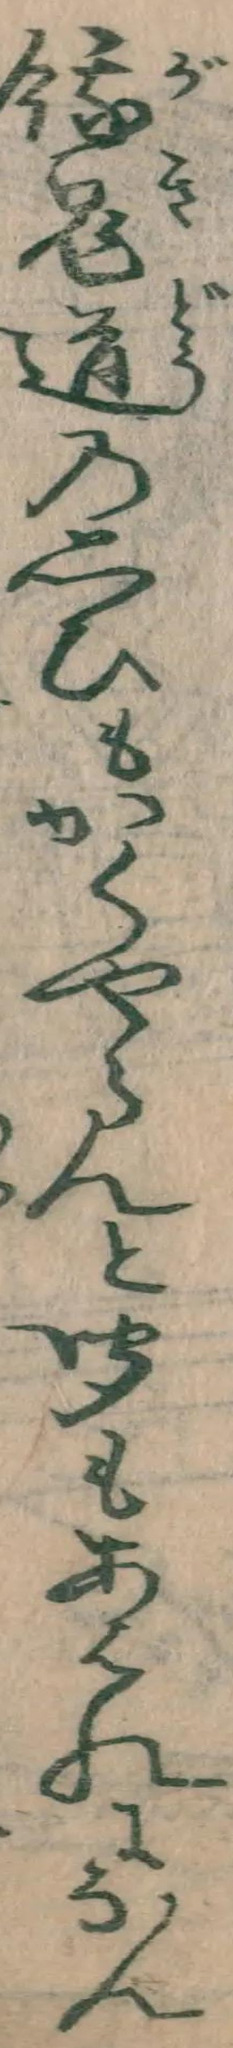餓鬼道の思ひもかくやらんと聞もあはれになん
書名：怪談御伽童 5巻. [1]
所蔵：国立国会図書館 National Diet Library, JAPAN
